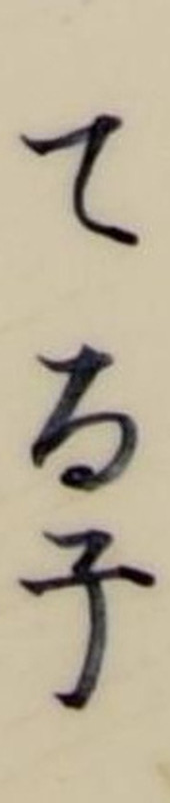てる子
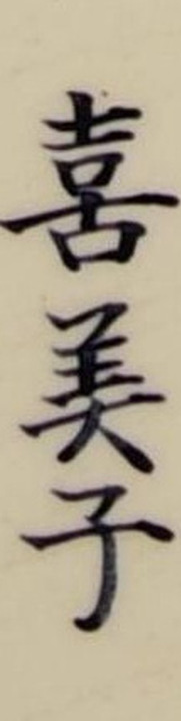喜美子
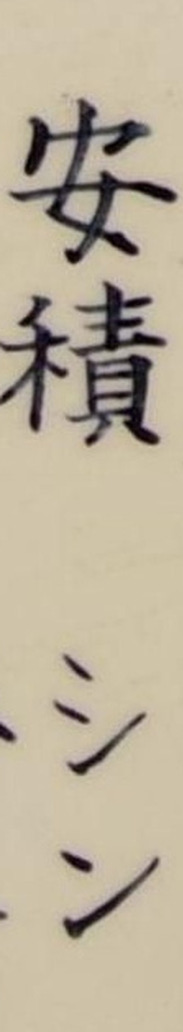安積シン
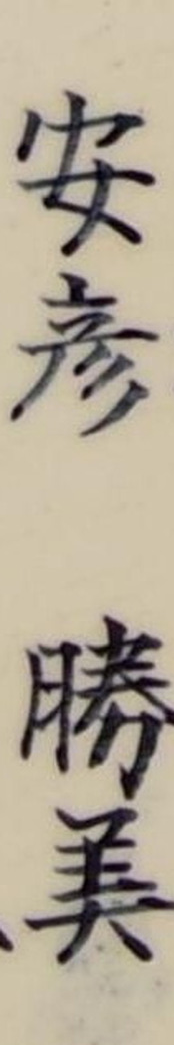安彦勝美
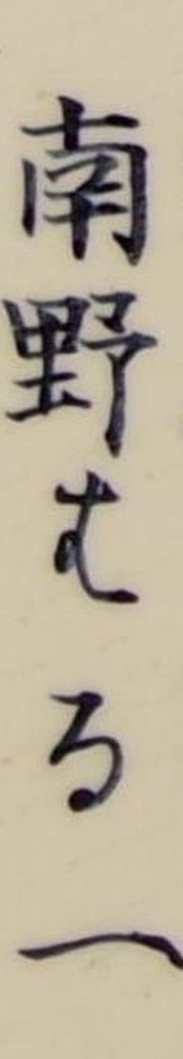南野はる一
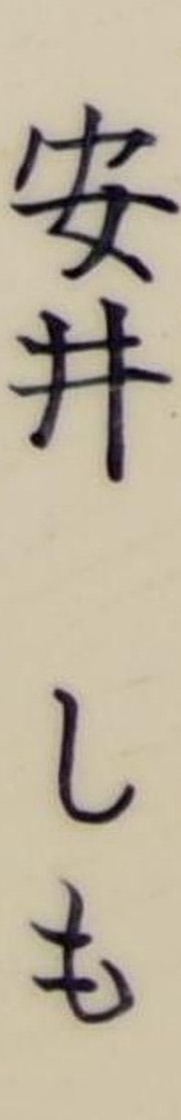安井しも
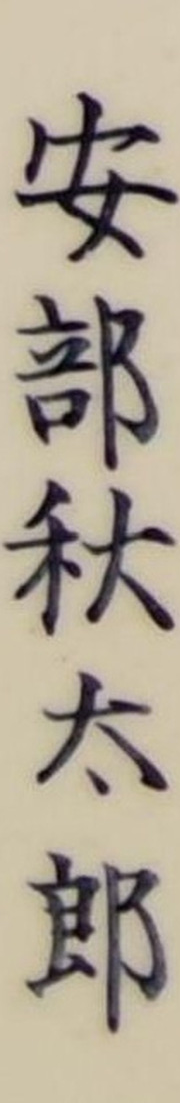安部秋太郎
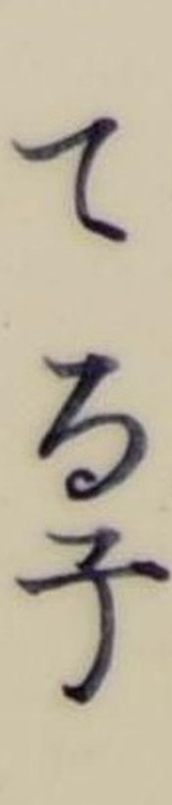てる子
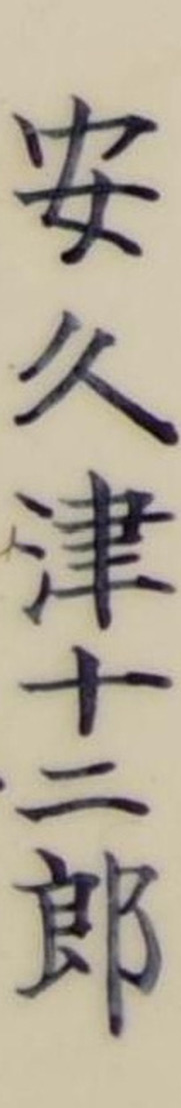安久津十二郎
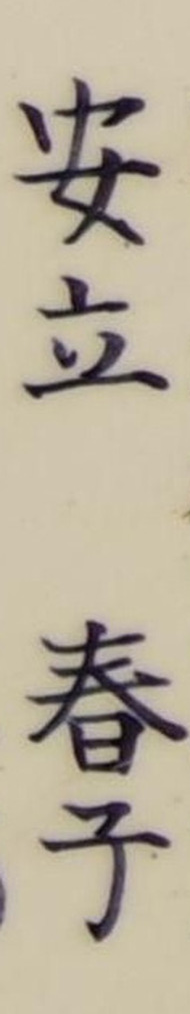安立春子
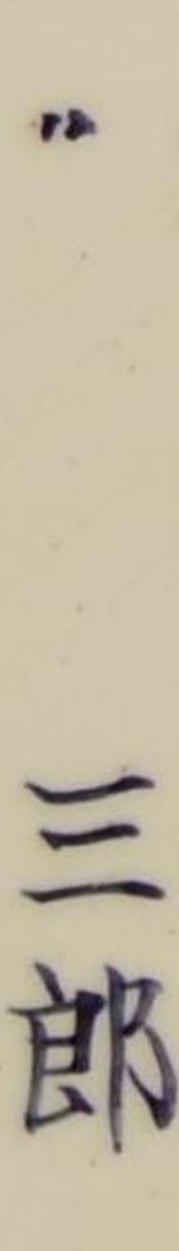済三郎
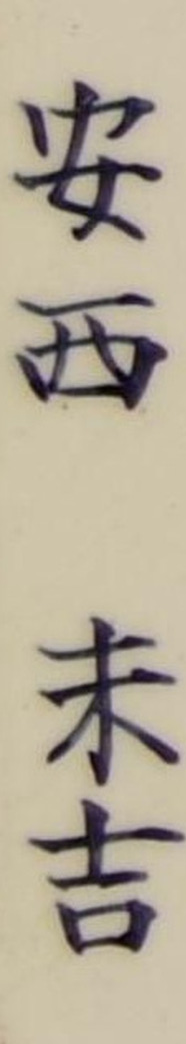安西末吉

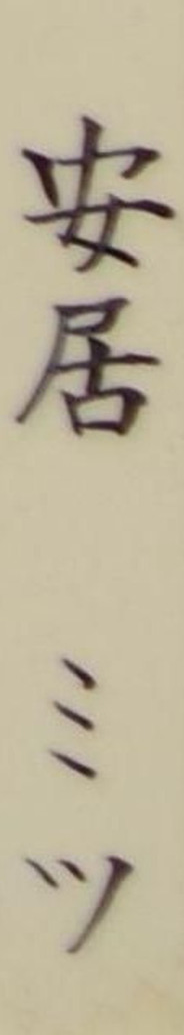安居ミツ
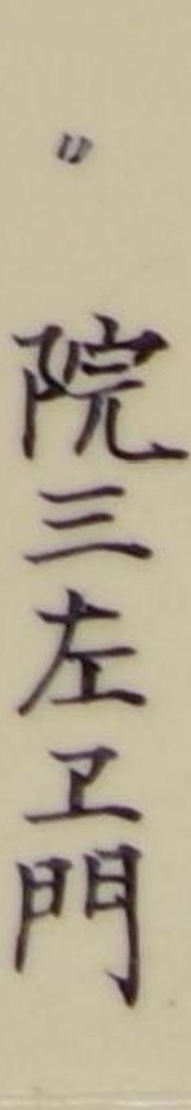院三左ヱ門
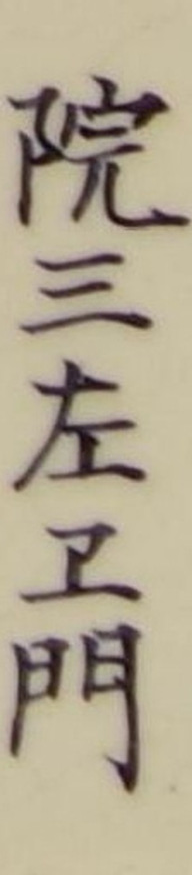院三左ヱ門
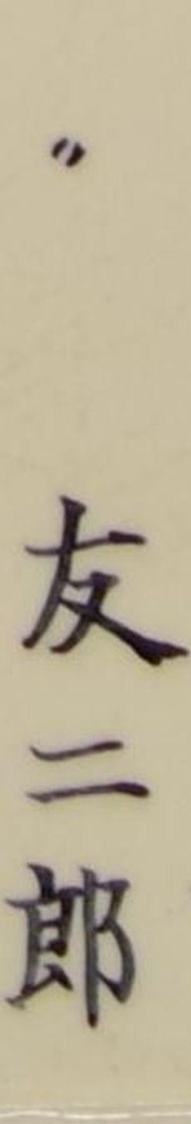友二郎
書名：A~D
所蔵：koyasan kongobuji
